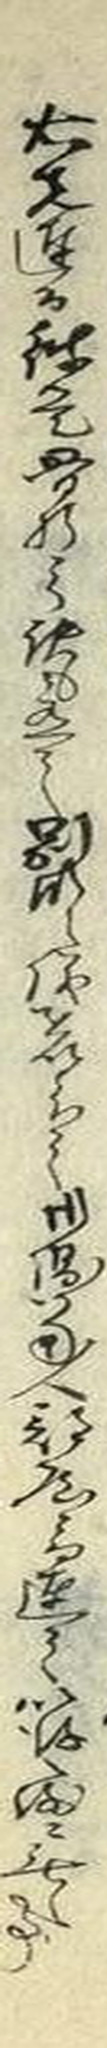右先達而彼是骨折之訳も有之別段之儀を以被下之御側御用人部屋ニ而達之以後之例ニ無之事
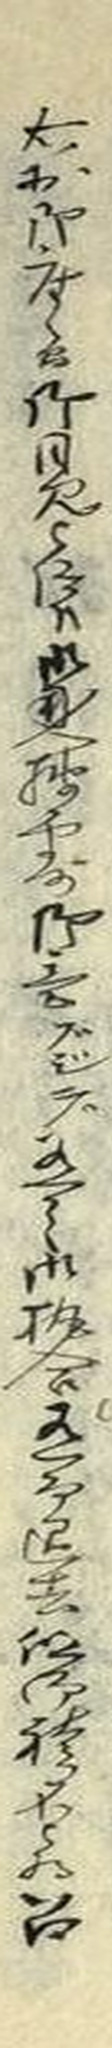右於御座之間御目見被仰付御用人披露御意ブジデ有之御執合有而退去但御袴不被為召
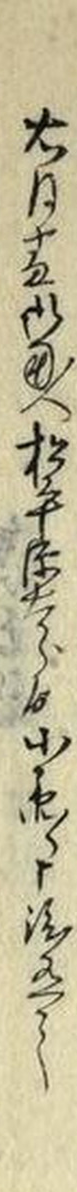右月番御用人松平源太郎ゟ小兵衛へ申渡有之
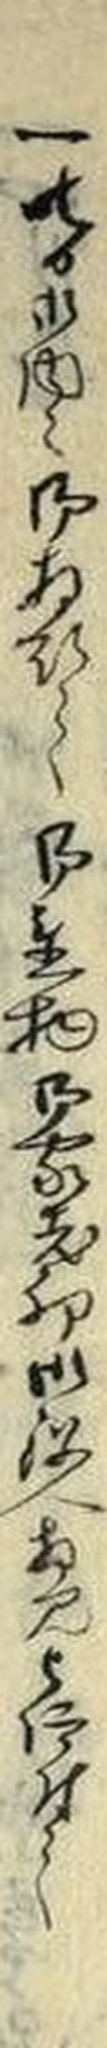一昨日御内々御拝領之御置物御家老初御役人拝見被仰付之

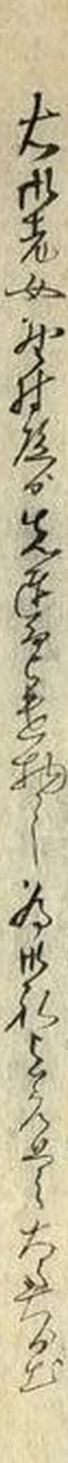右御老女野村殿ゟ先達而被遣物之為御礼被差上之大奥ゟ出
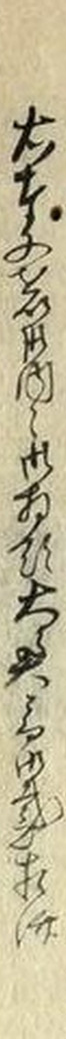右奉文を以御御内々御拝領大奥ニ而御戴相済
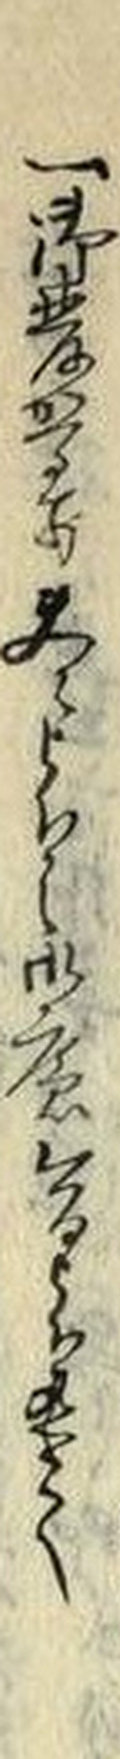一御発駕前夫々被下之御廉今日被下有之
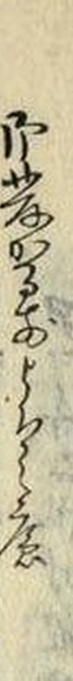御発駕前被下之廉
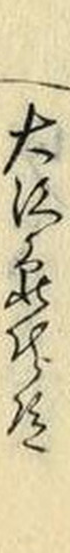長沢亀次郎殿
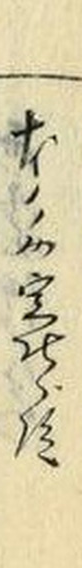本多定次郎殿
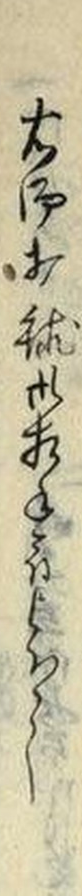右御打毬御相手ニ付被下之
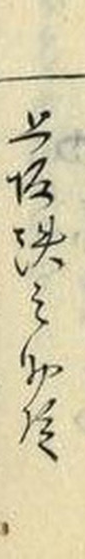上坂鉄之助殿
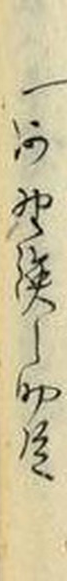河野鍈之助殿
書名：少傅日録抄（斉善付側向頭取日記、在府）
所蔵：福井県文書館 Fukui Prefectural Archives
